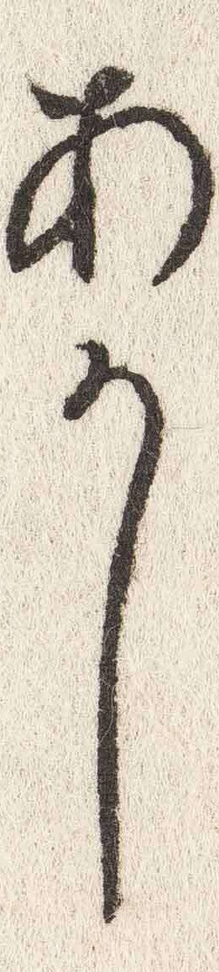あかし
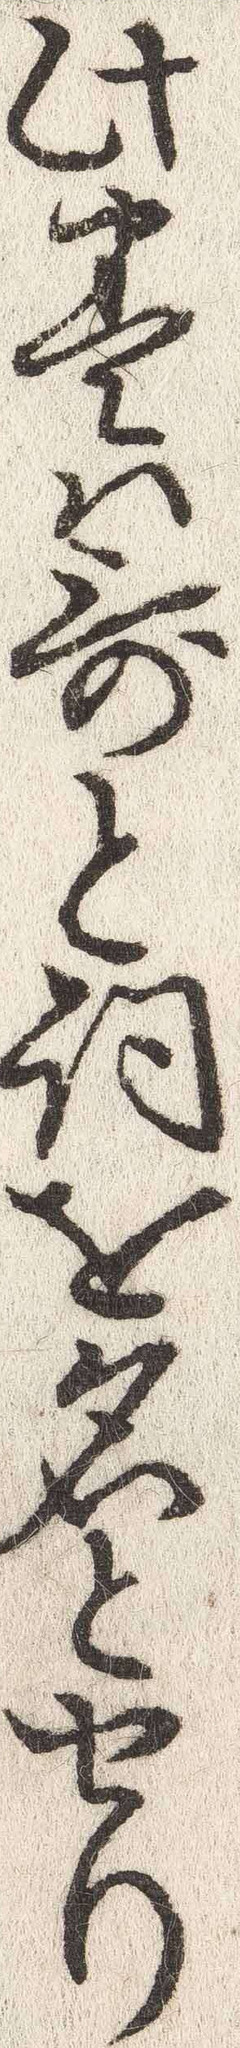此巻は歌と詞を名とせり
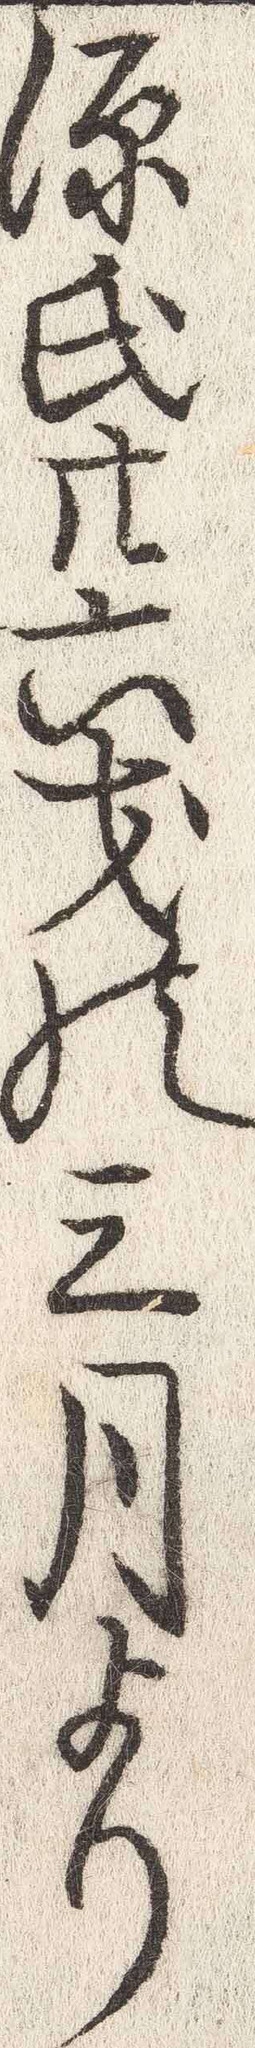源氏廿六才の三月より
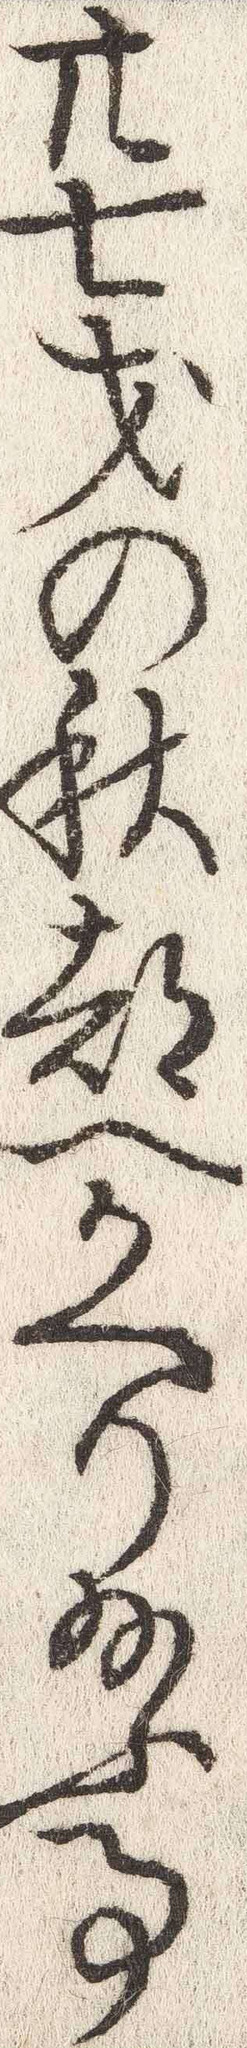廿七才の秋都へかへり給ふ事
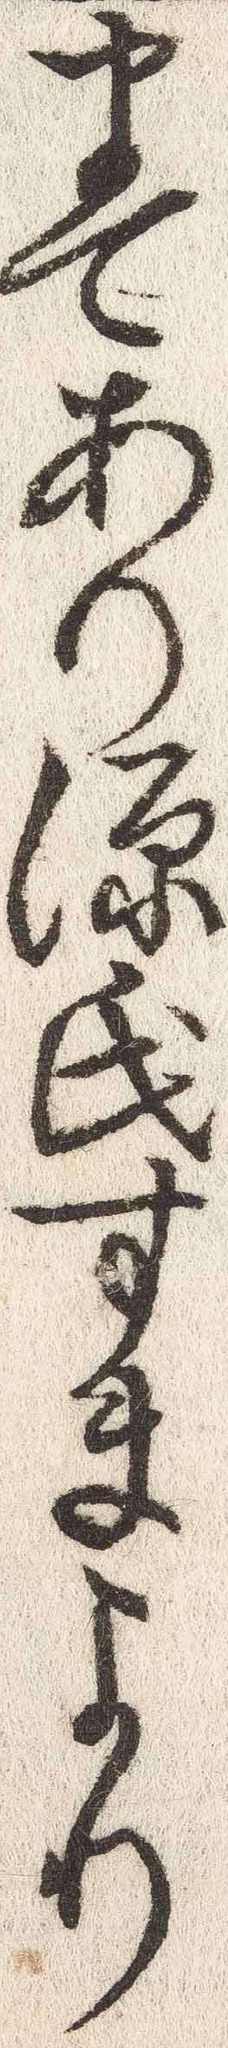まてあり源氏すまより
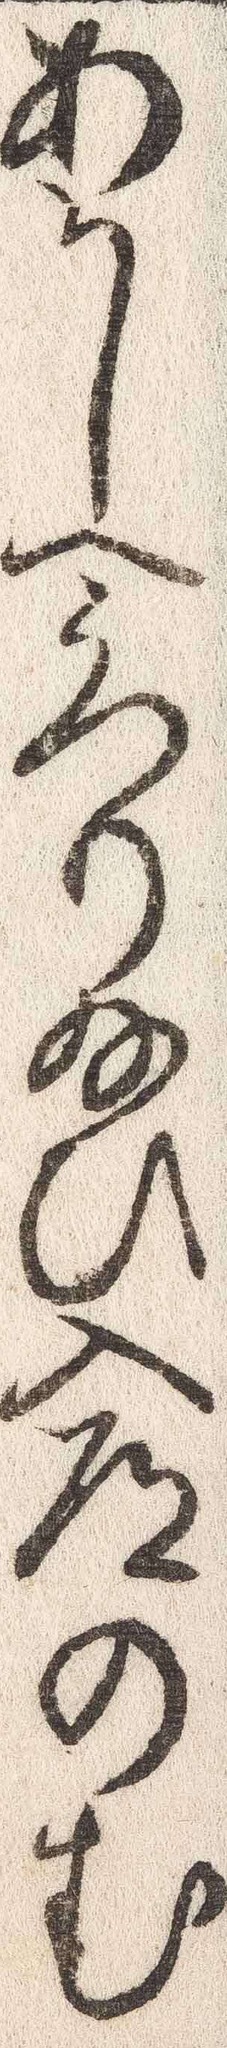あかしへうつり給ひ入道のむ
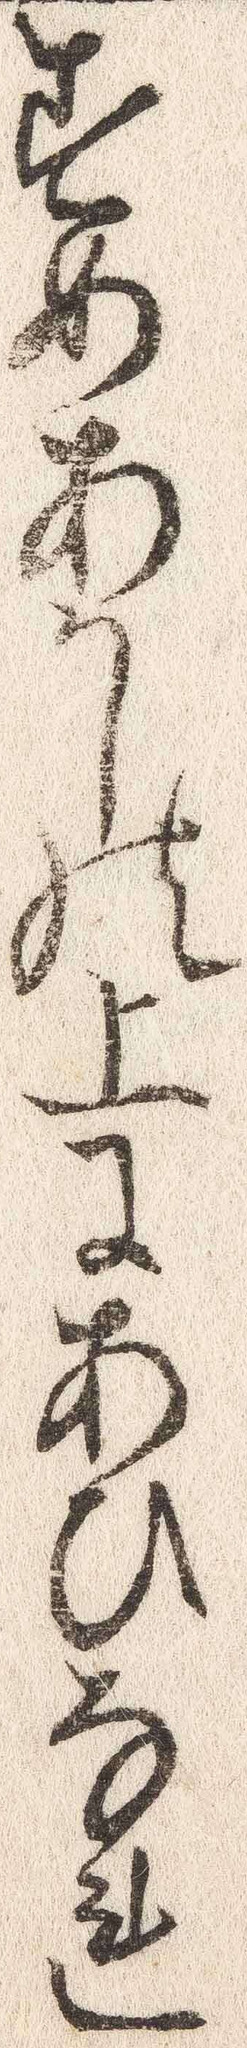すめあかしの上にあひなれ
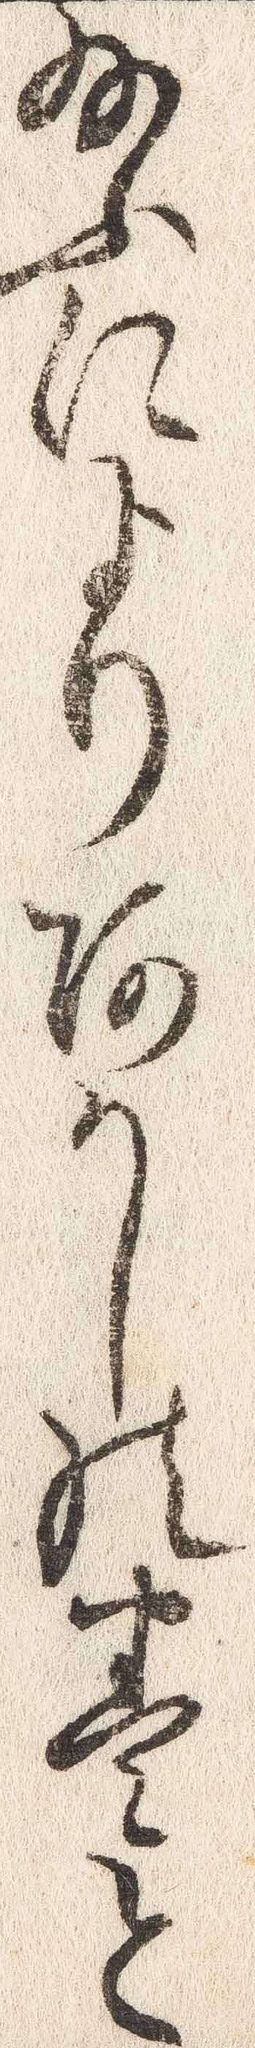給ふによりあかしの巻と
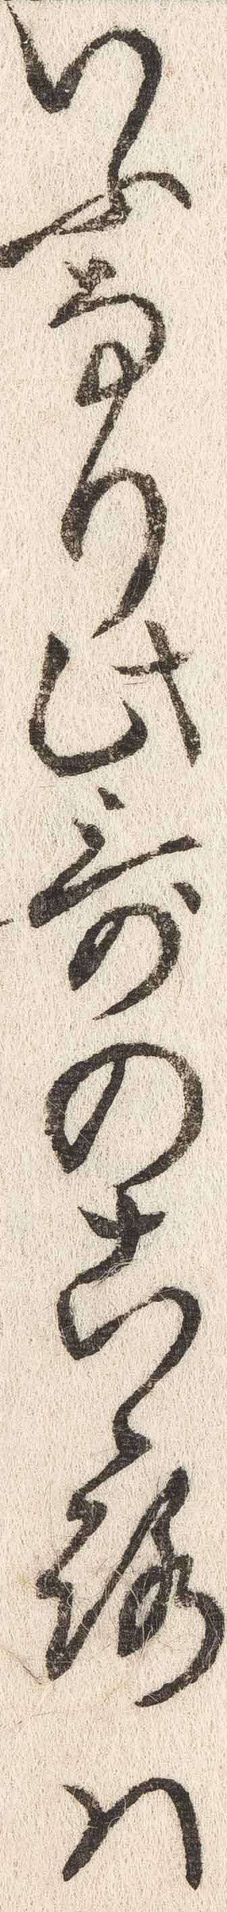いふなり此歌のこゝろは
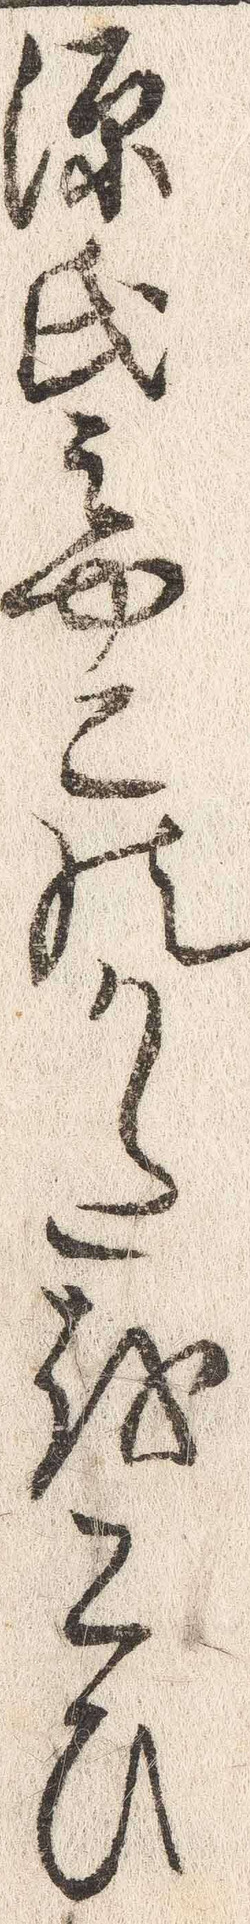源氏みやこのかたをこひ

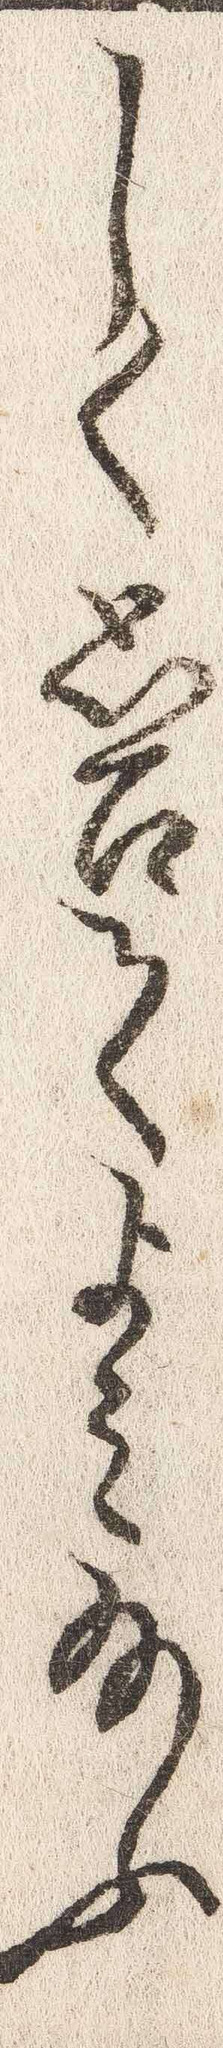しく思召てよみ給ふ
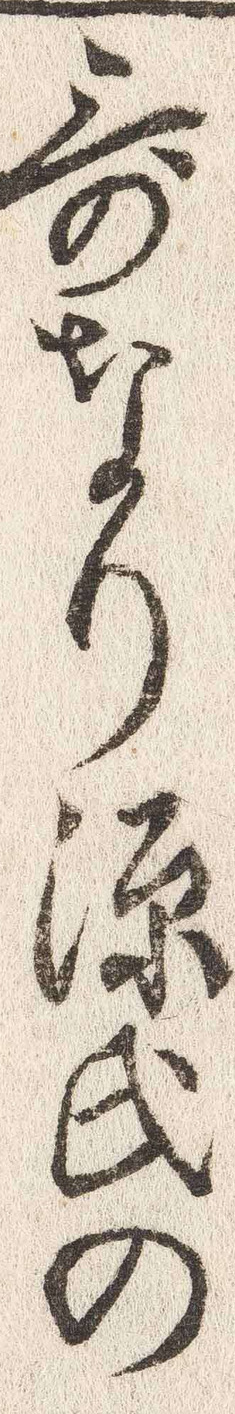歌なり源氏の
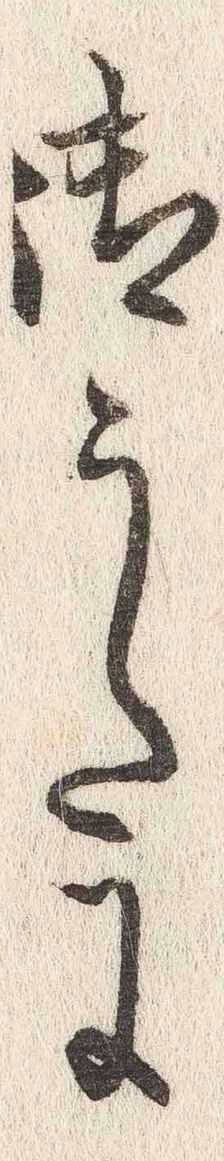御うたに
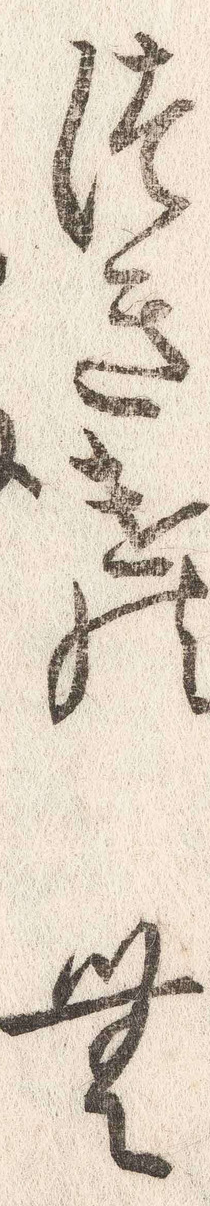つきけのむ
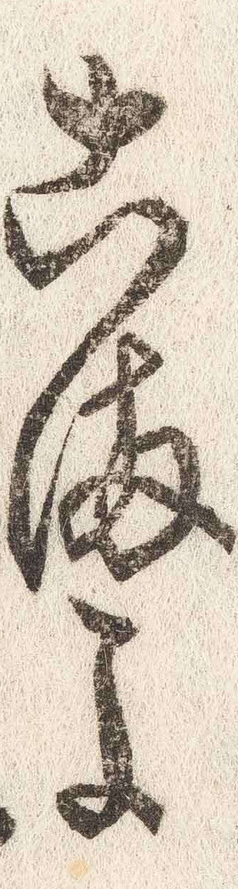こまよ
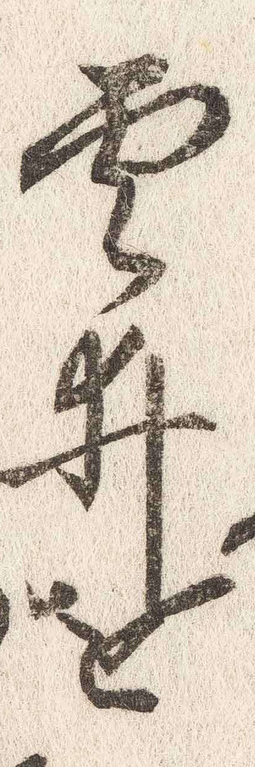雲井を
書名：源氏物語
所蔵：東京学芸大学附属図書館 国文学研究資料館
